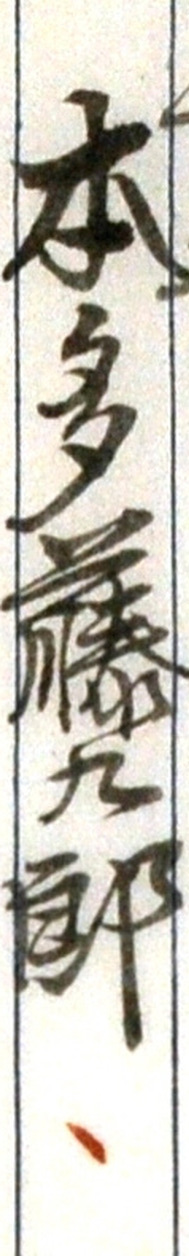本多籐九郎
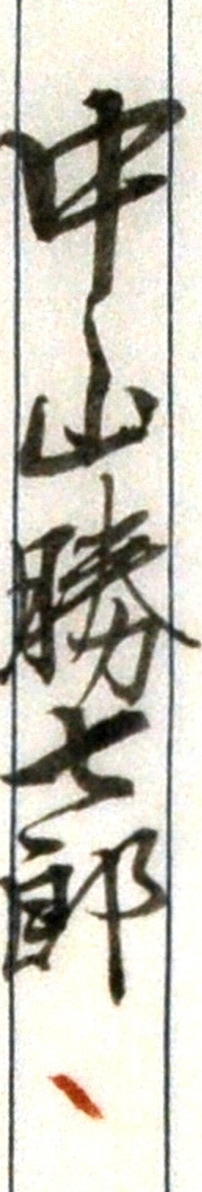中山勝七郎
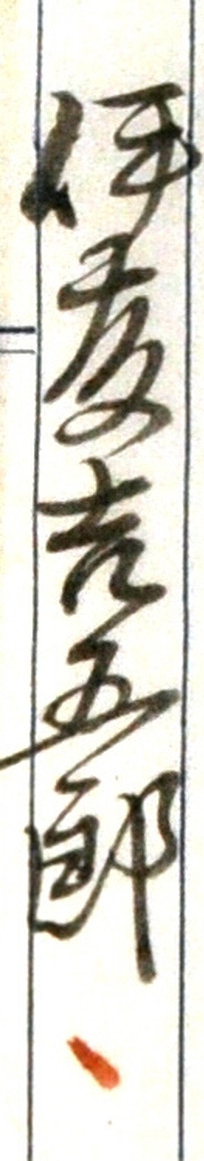伊藤吉五郎
